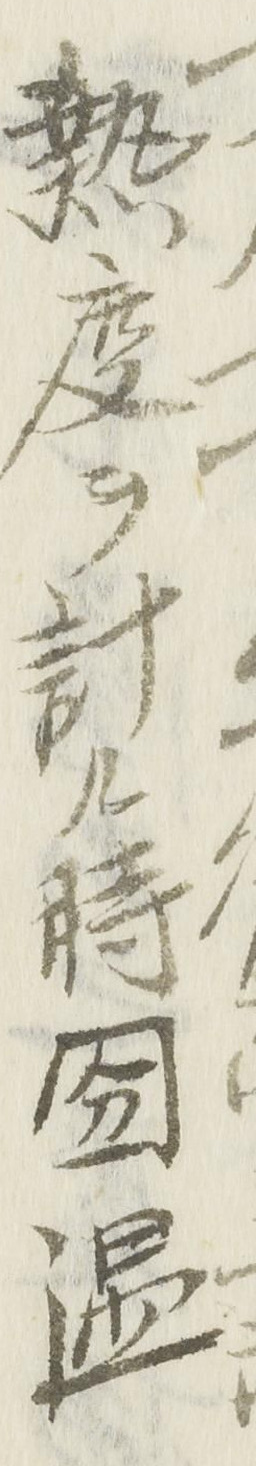熱度を計ル時分温
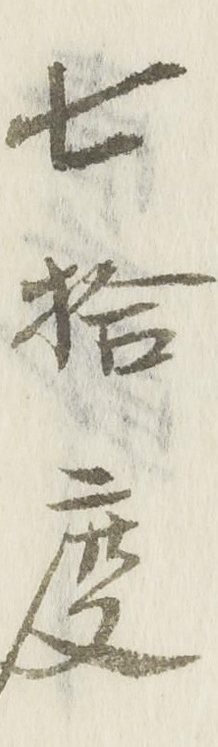七拾度
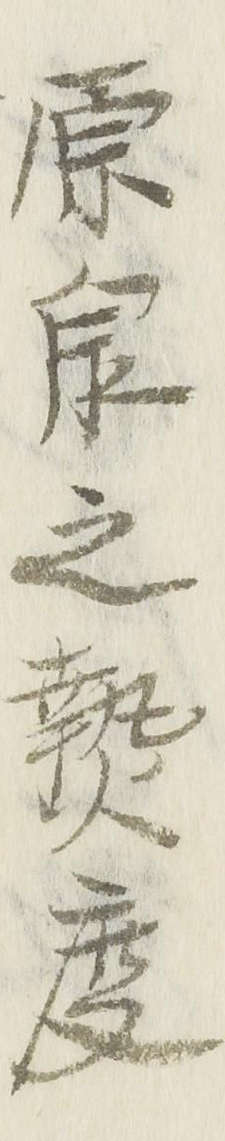原泉之熱度
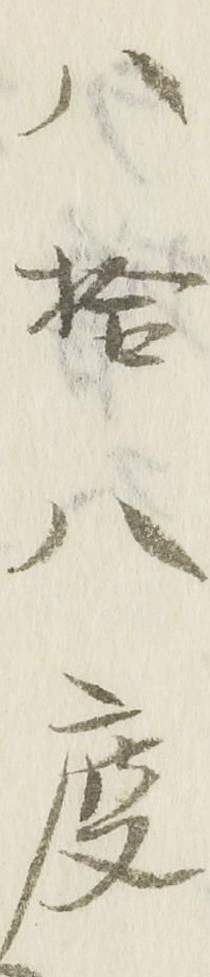八拾ハ度
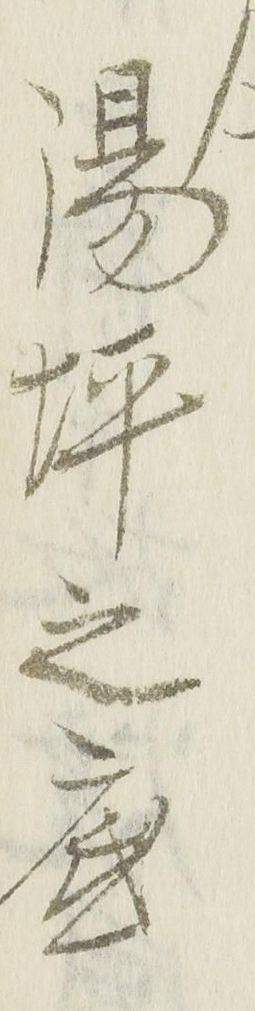湯坪の底

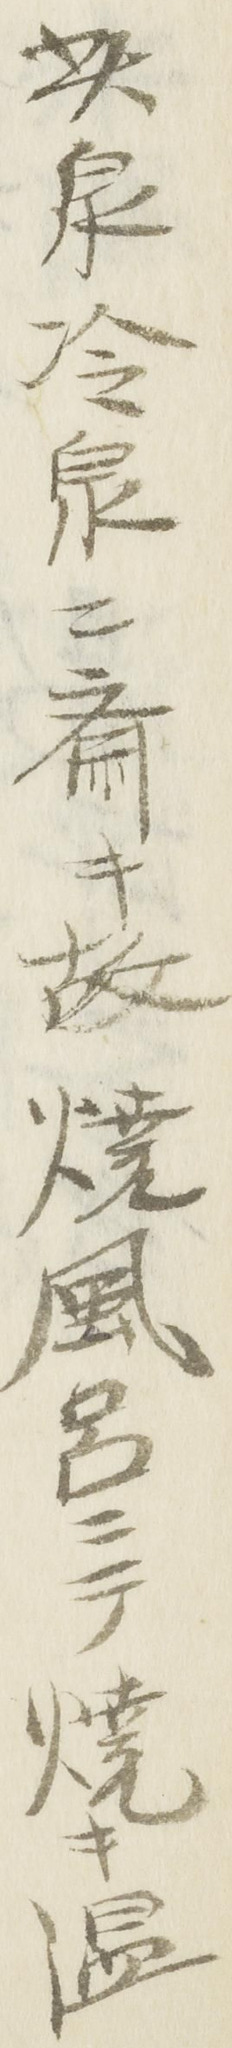此泉冷泉ニ斎キ故焼風呂ニテ焼き温
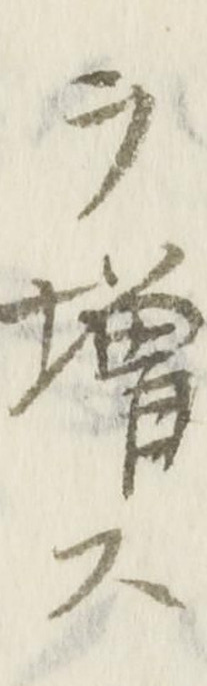ヲ増ス
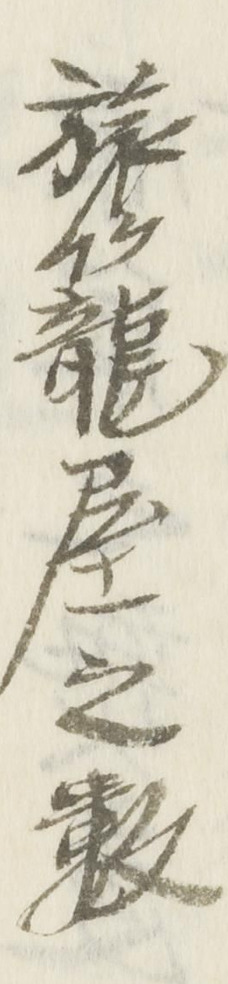旅籠屋之数
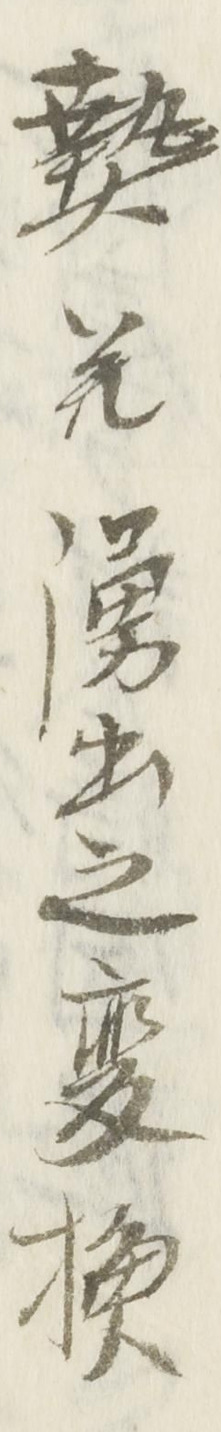熱并湧出之変換
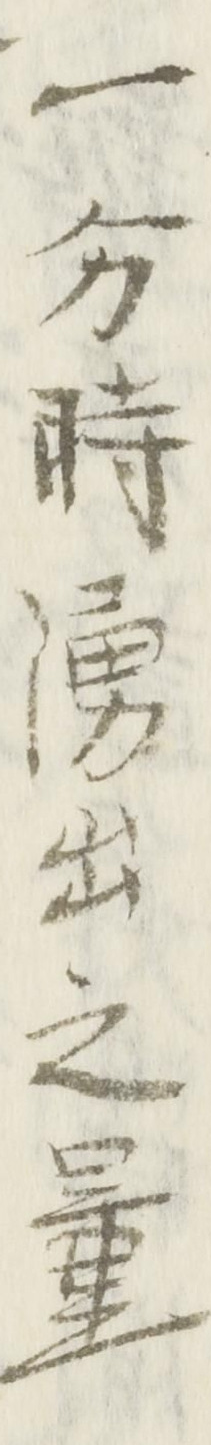一分時湧出之量
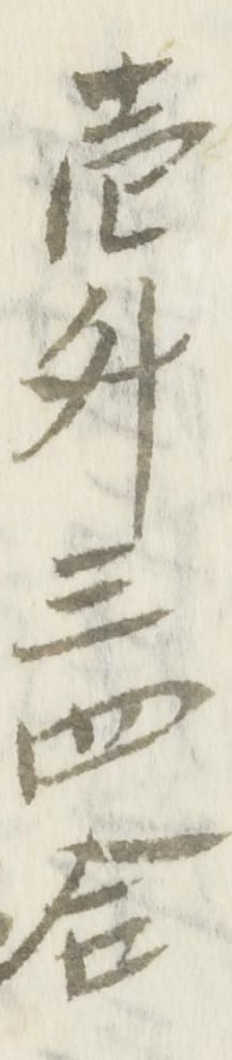壱升三四合
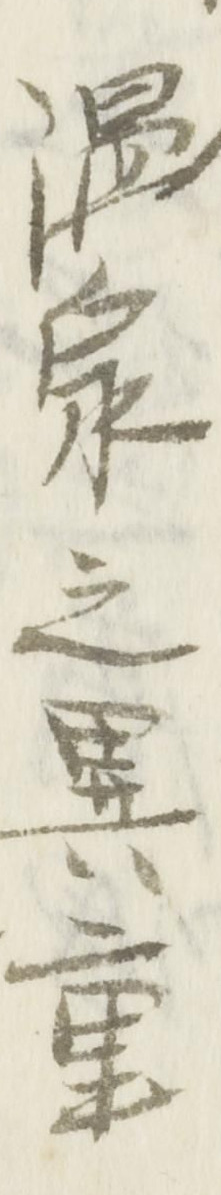温泉之異重
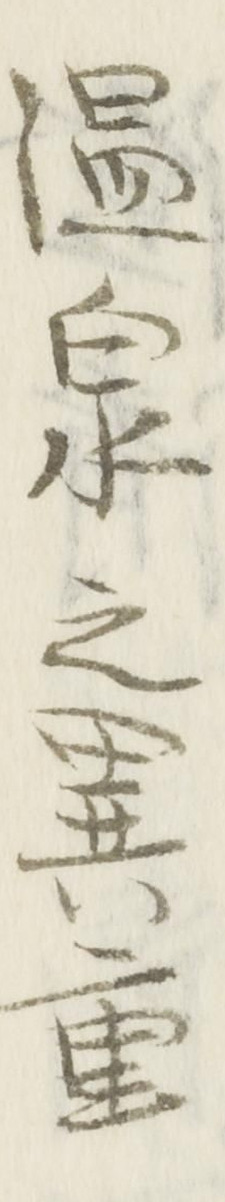温泉之異重
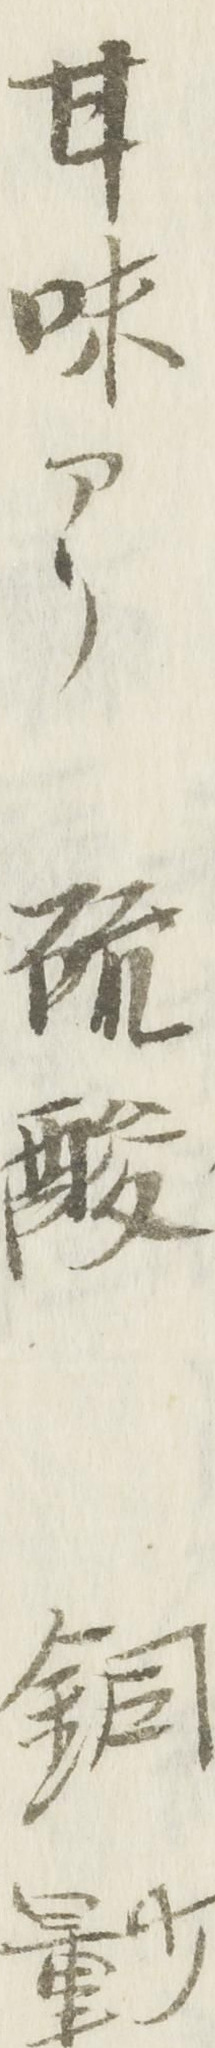甘味アリ硫酸銅少量
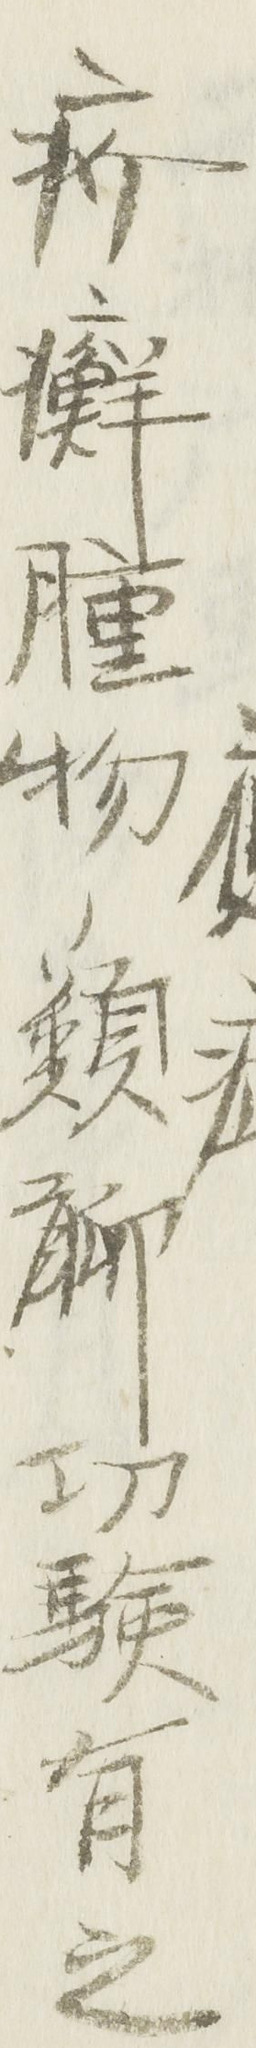疥癬腫物ノ類聊功験有之

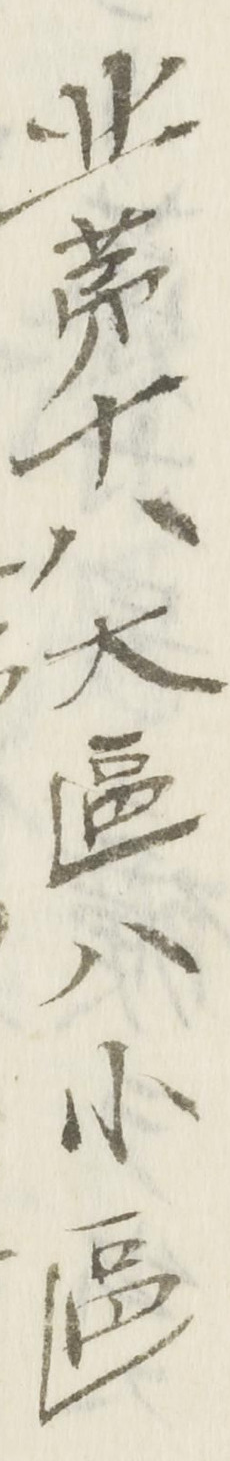北第十八大区ハ小区
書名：温冷泉試験表
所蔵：東京大学地震研究所図書室 Earthquake Research Institute Library, The University of Tokyo, JAPAN
